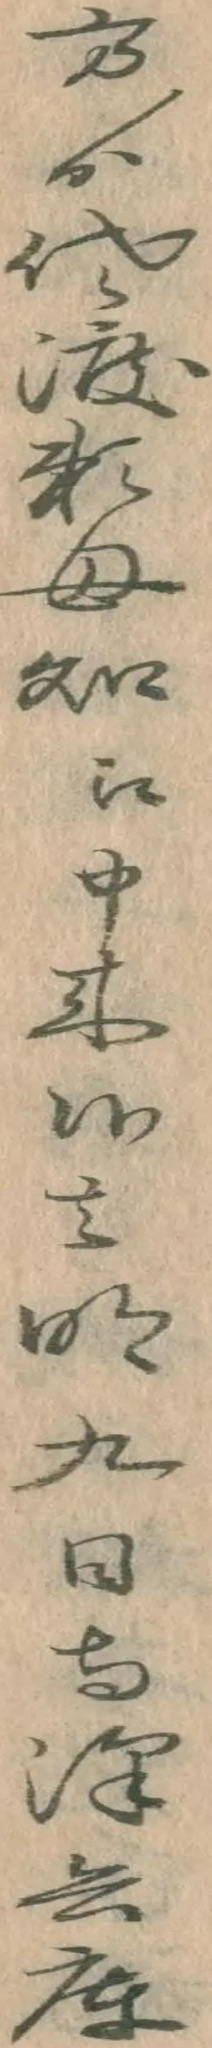方ゟ佐渡頼母処江申来候者明九日寺沢兵庫
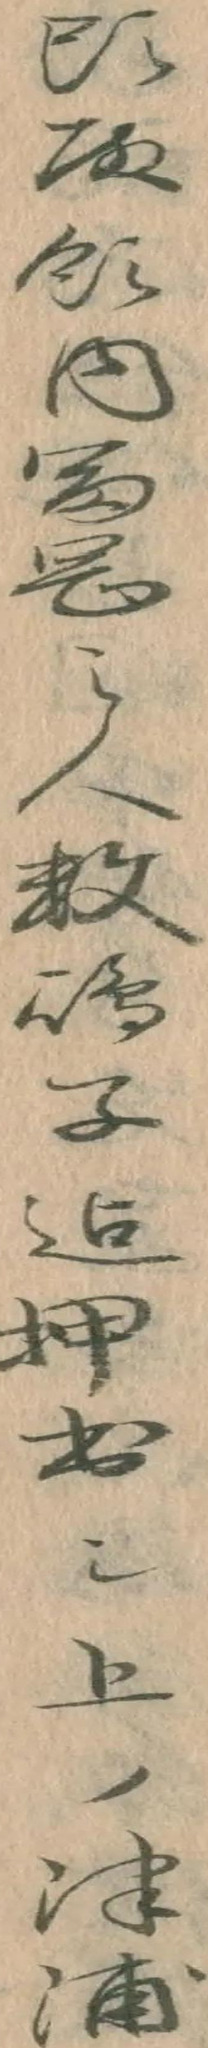頭殿領内冨岡之人数島子迄押出し上之津浦
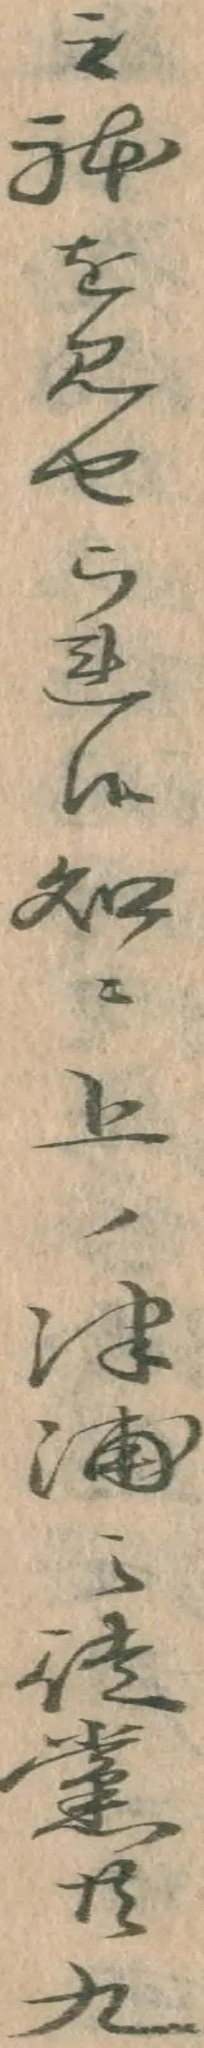之躰を見せら連候処に上之津浦之徒党共九
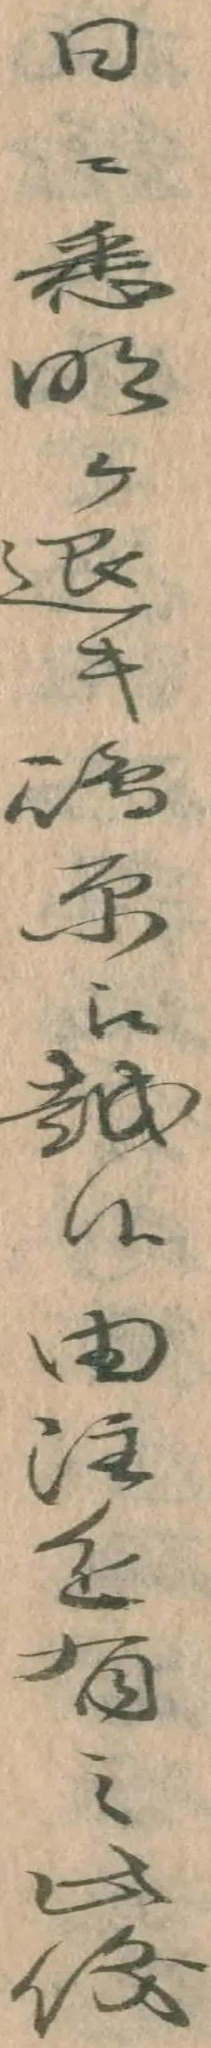日に悉明け退き島原江越候由注進有之此儀
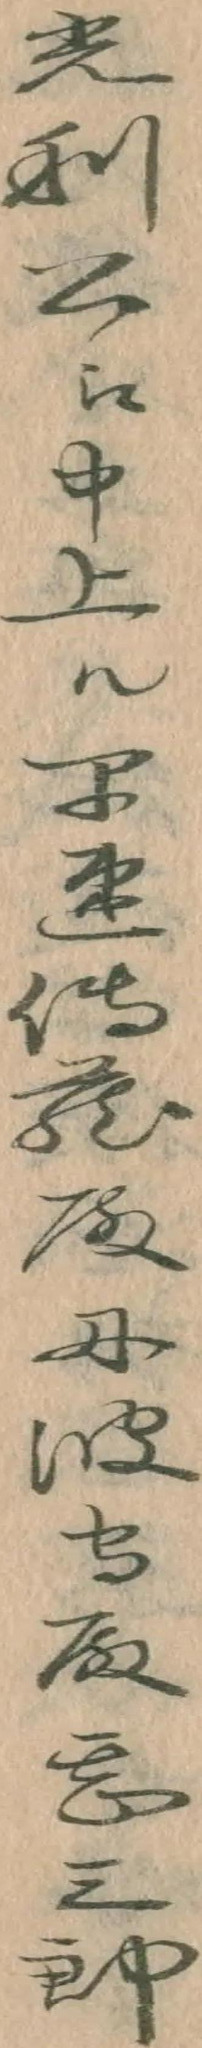光利公江申上候早速伝蔵殿丹波守殿甚三郎
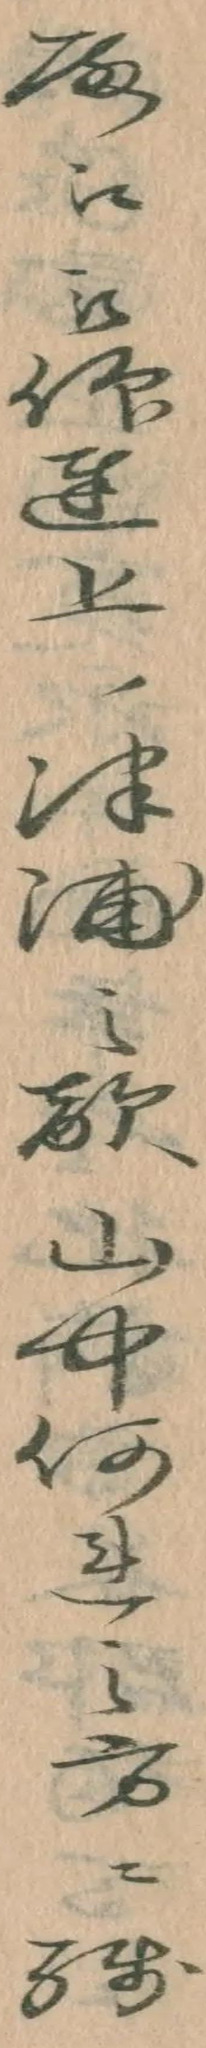殿江被仰達上之津浦之敵山中何連之方に残
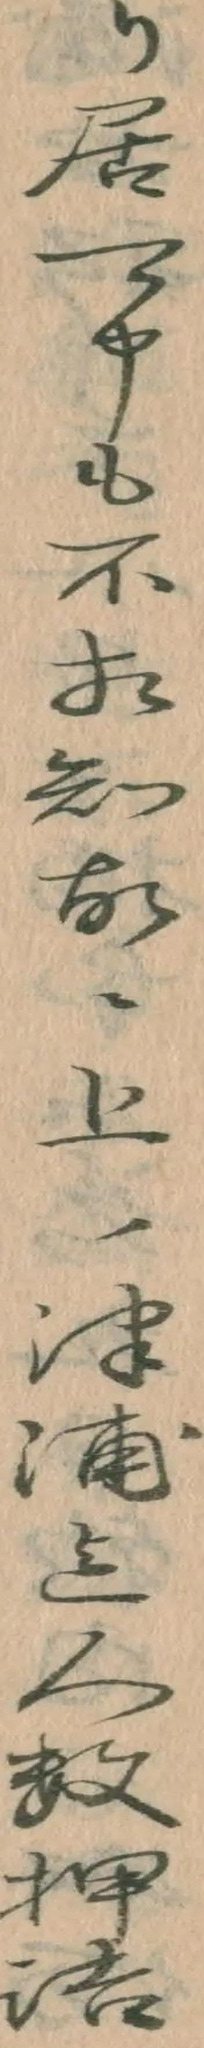り居可申も不相知故に上之津浦迄人数押詰
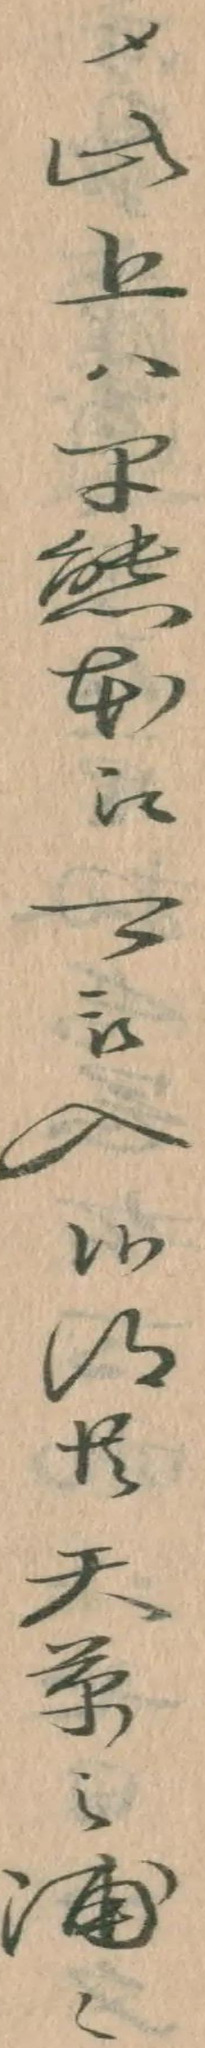め此上は早熊本江可被入候得共天草之浦々
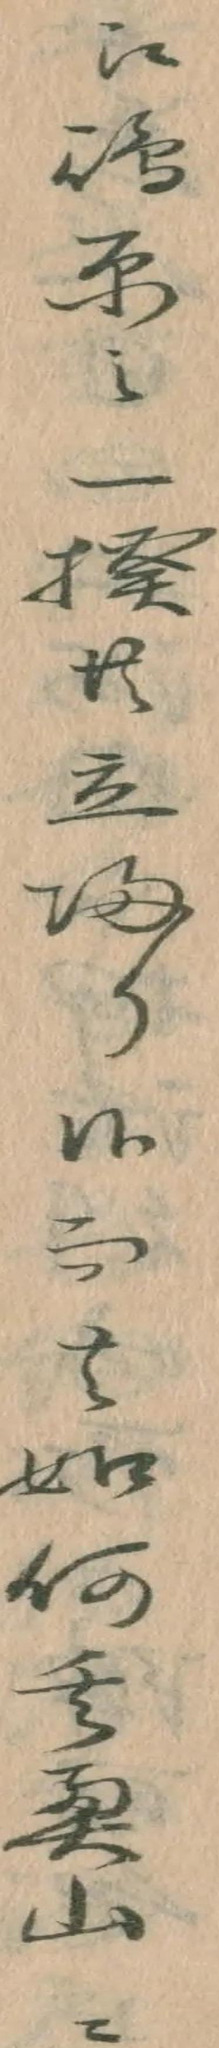江島原之一揆共立帰り候而者如何其奥山に
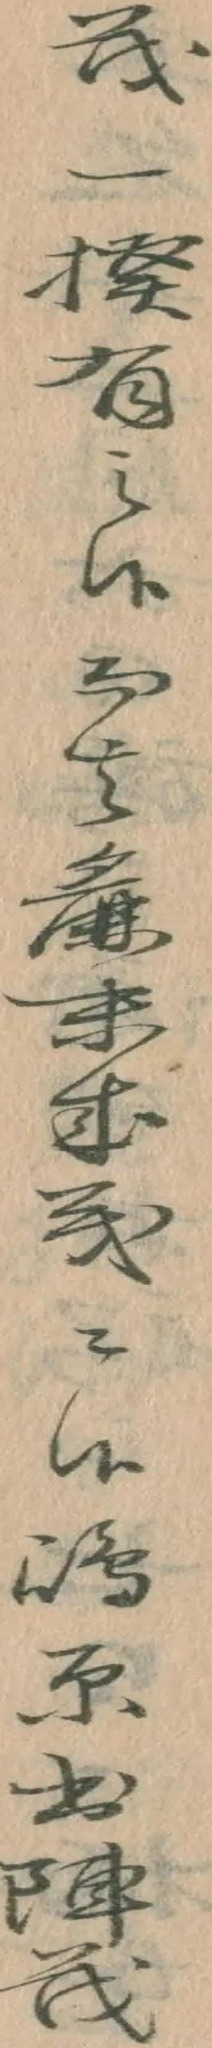茂一揆有之候而者廉末成義に候島原出陣茂
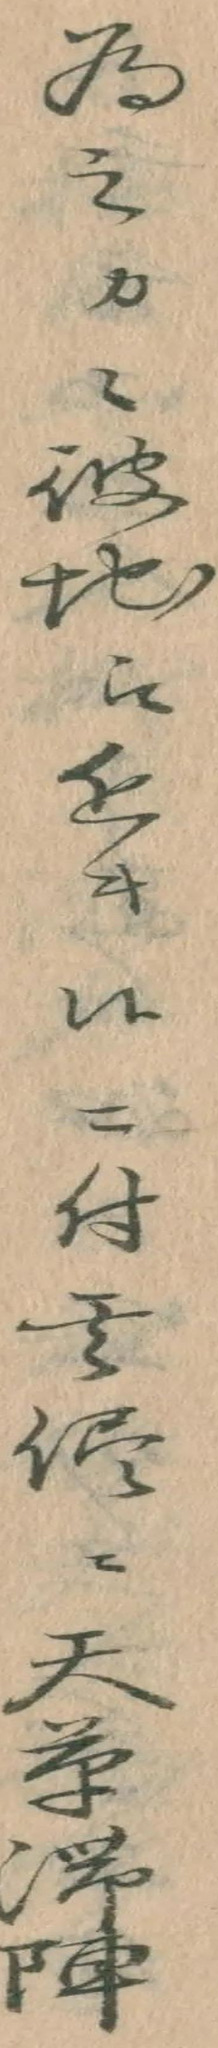為之力に彼地江近き候に付其侭に天草滞陣
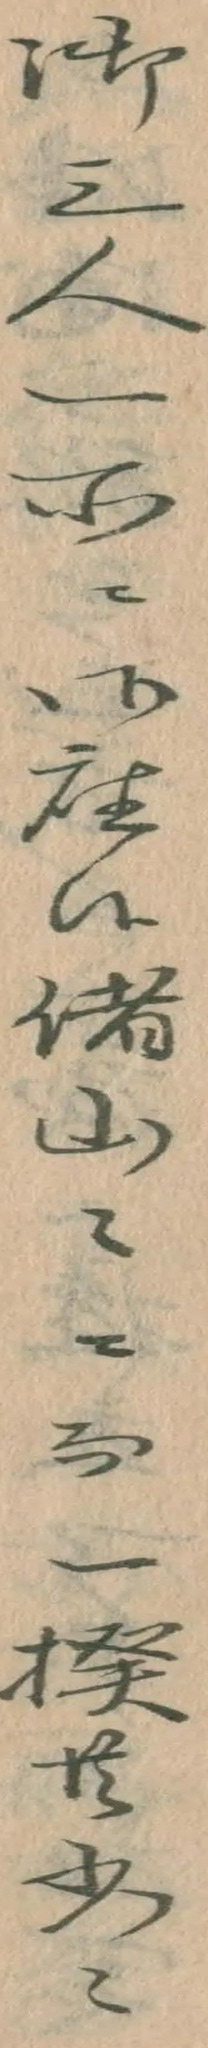御三人一所に御座候偖山々に而一揆共少々
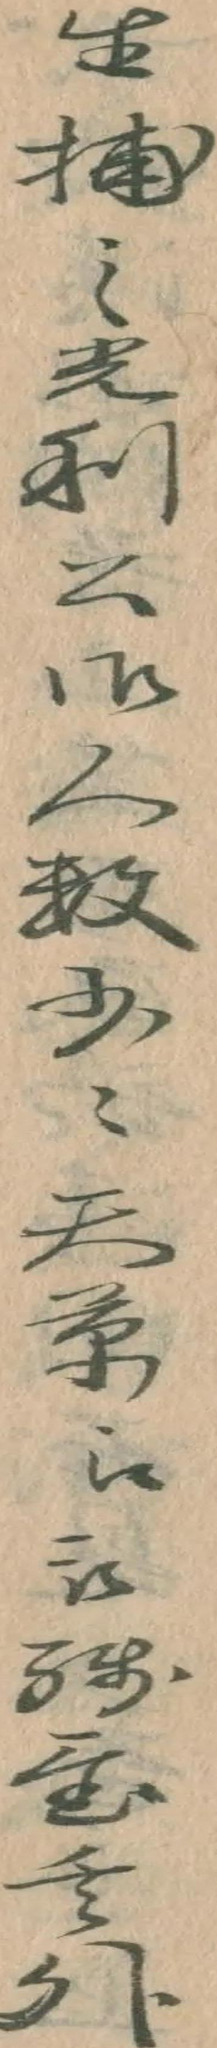生捕之光利公御人数少々天草江被残置其外
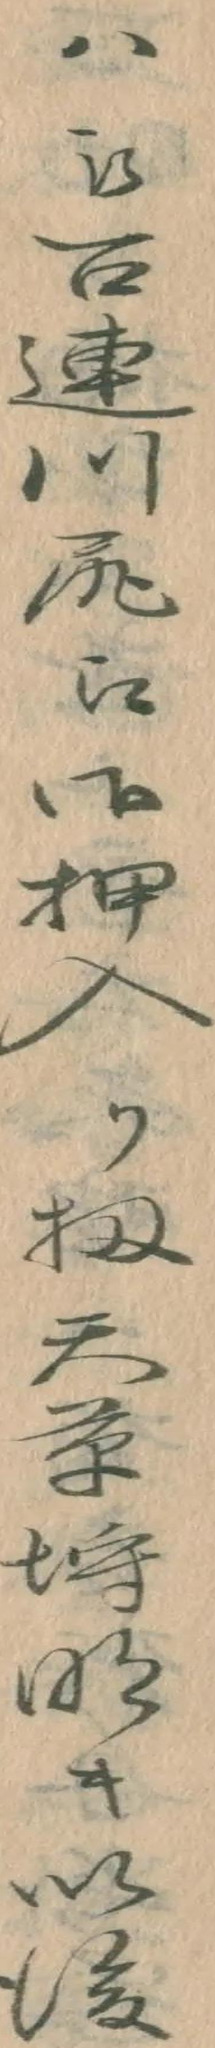は被召連川尻江御押入り扨天草埒明き以後
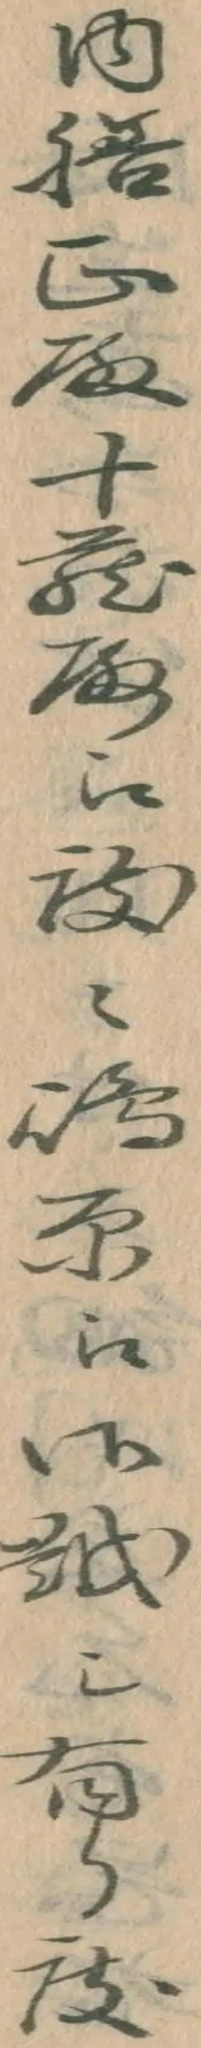内膳正殿十蔵殿江度々島原江御越し有り度
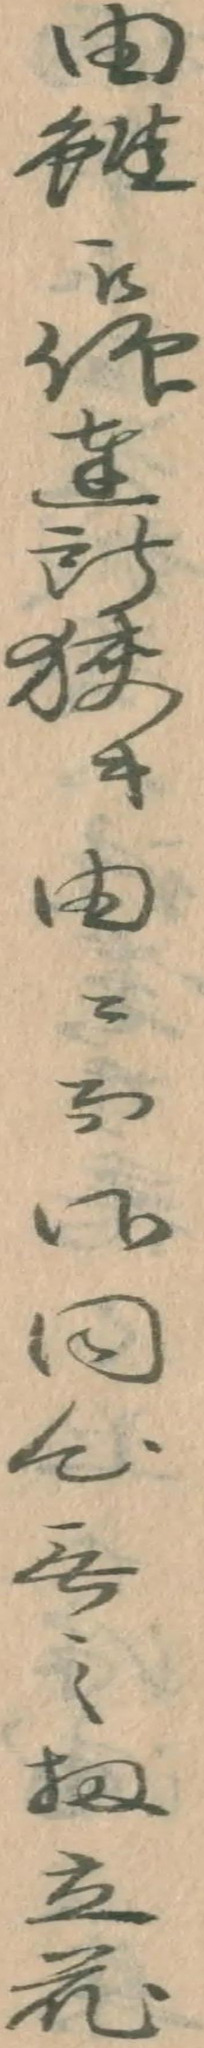由雖被仰達所狭き由に而御同心無之扨立花
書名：切支丹御退治記 49巻. [4]
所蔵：国立国会図書館 National Diet Library, JAPAN
